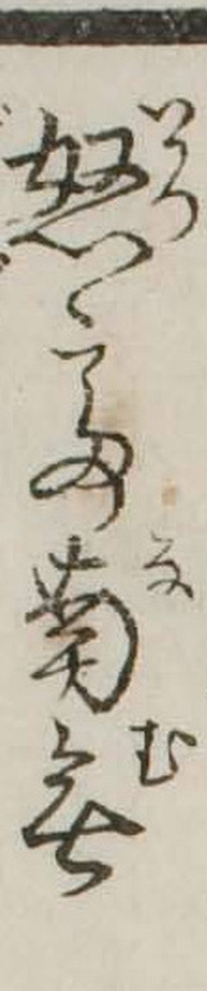怒て南無
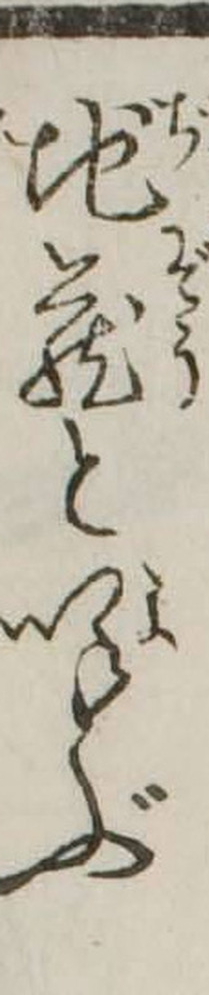地蔵と呼ぶ
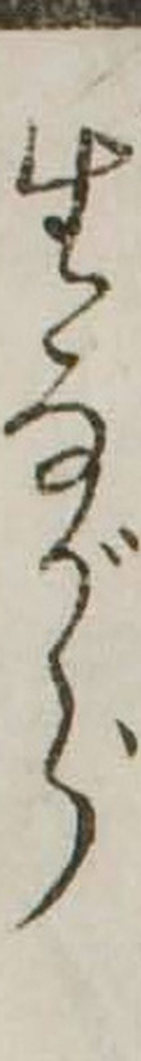生ながら
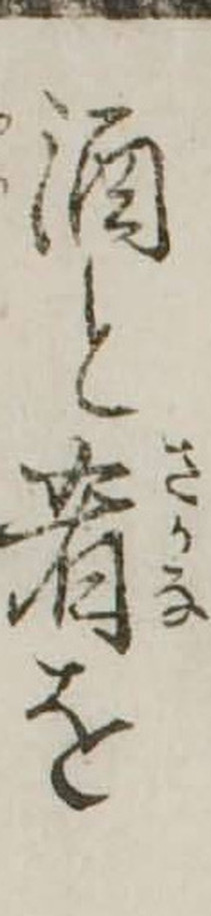酒と肴を
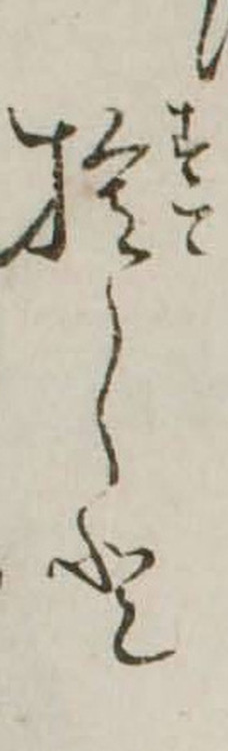捨しと

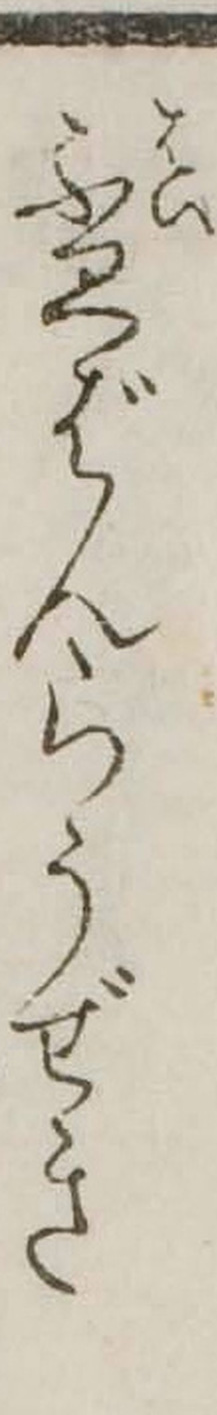盃ばんらうぜき
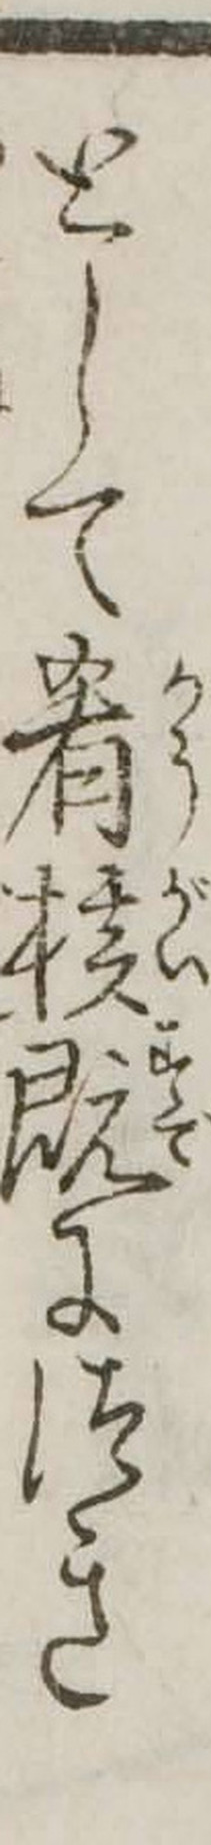として肴核既につき
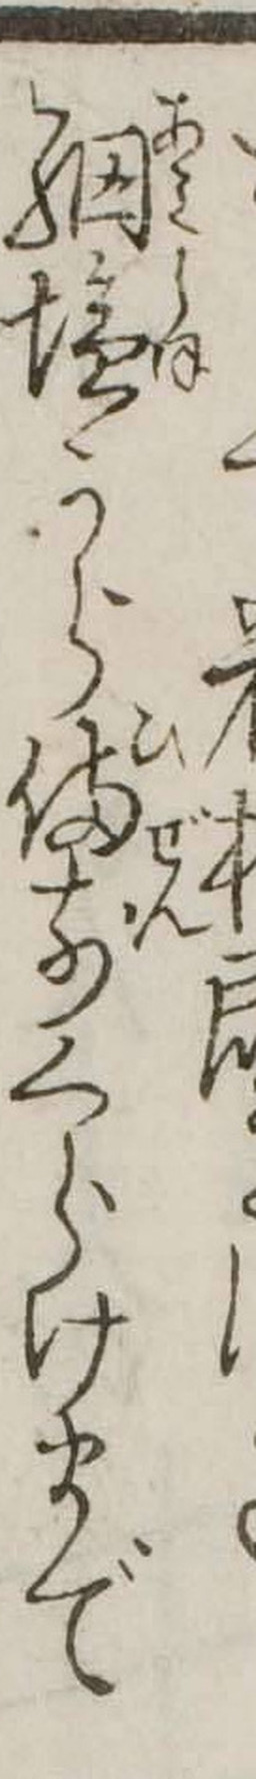網塩から備前くらけまで
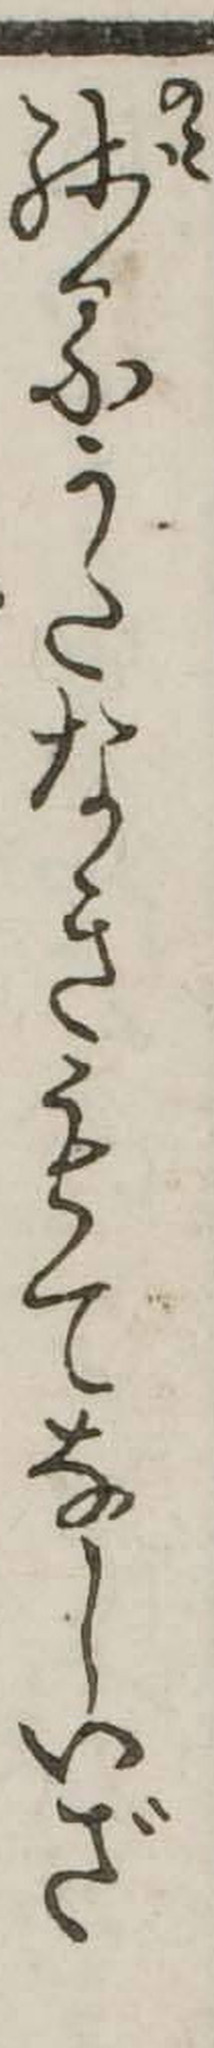残るかたなきもてなしいざ
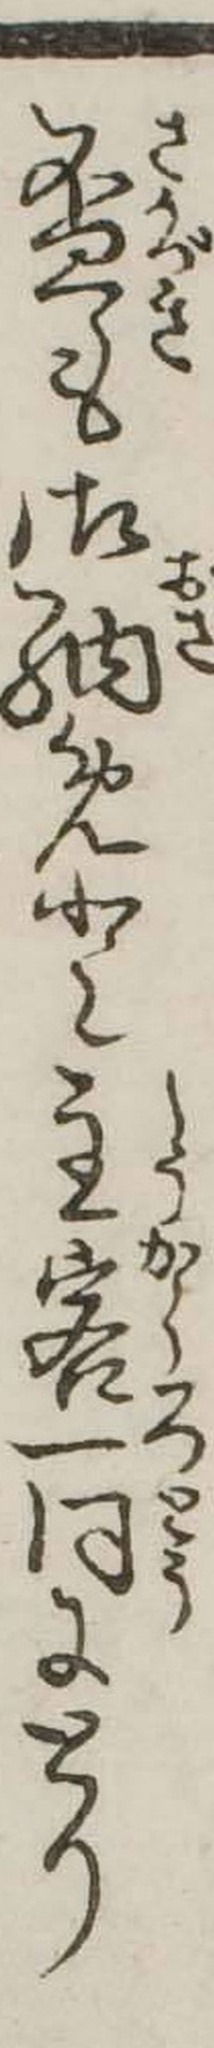盃も御納めと主客一同にとり
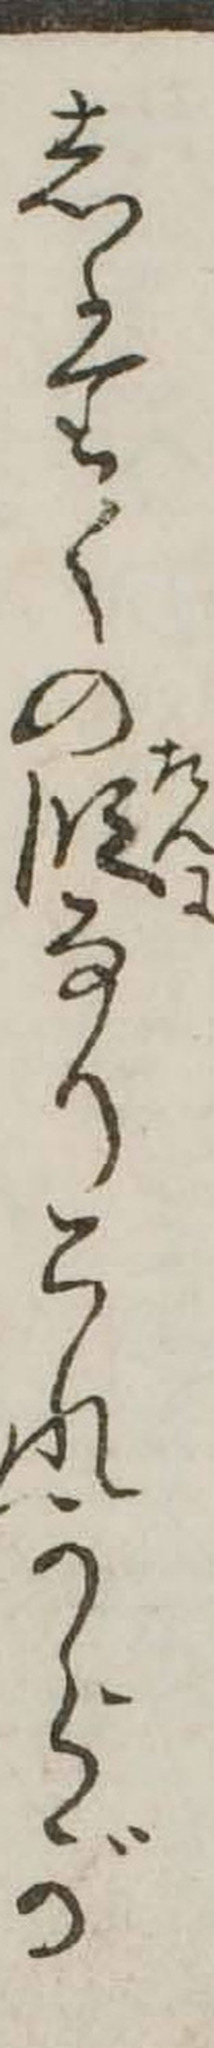したくの段なりこれからが
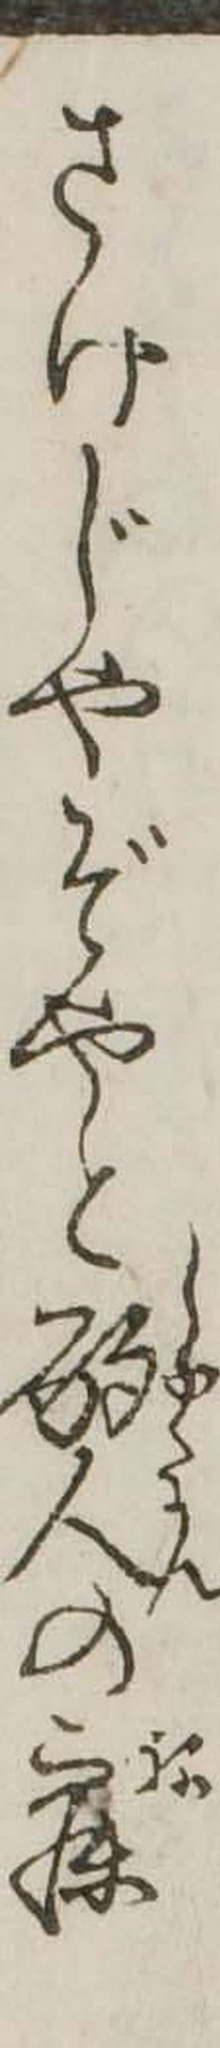さけじやぞやと酌人の寝
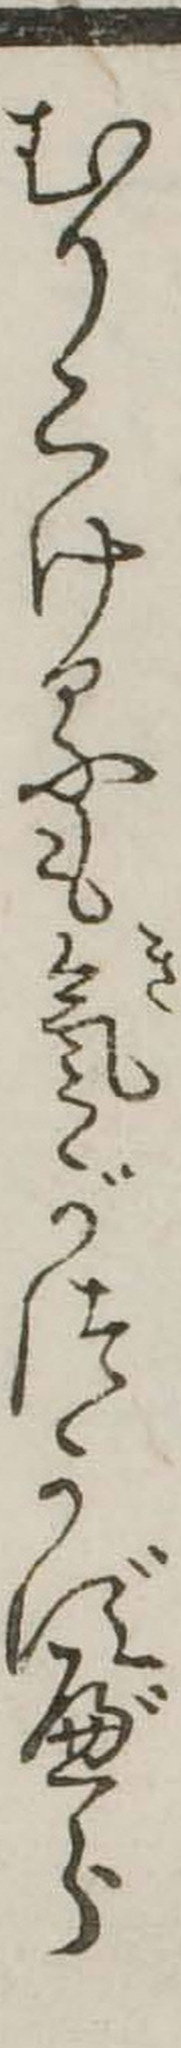むりこけるも気がつかずべら
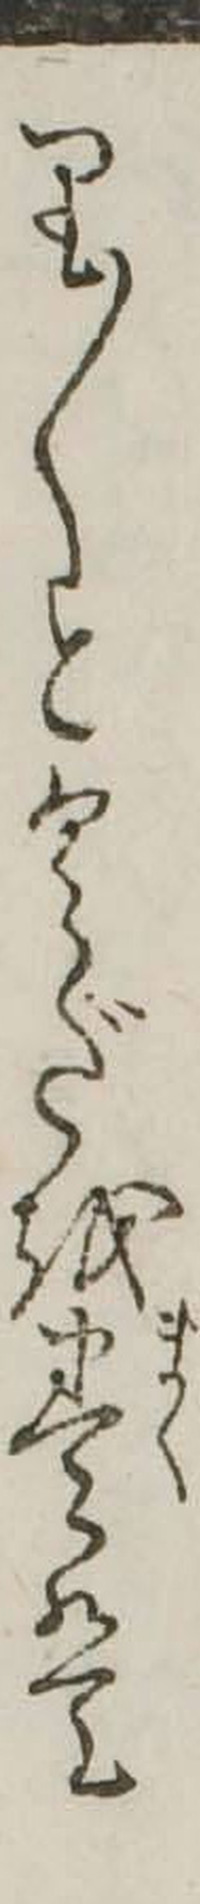り〳〵とくだを巻は
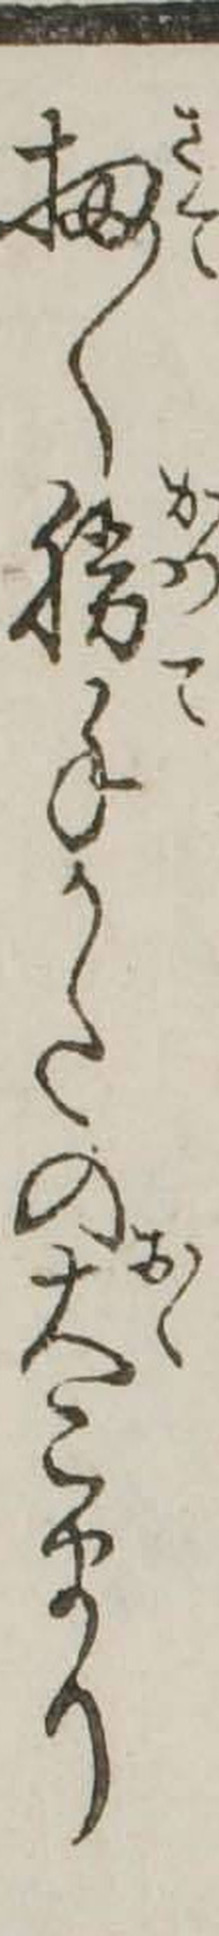扨〳〵勝手かたの大こまり
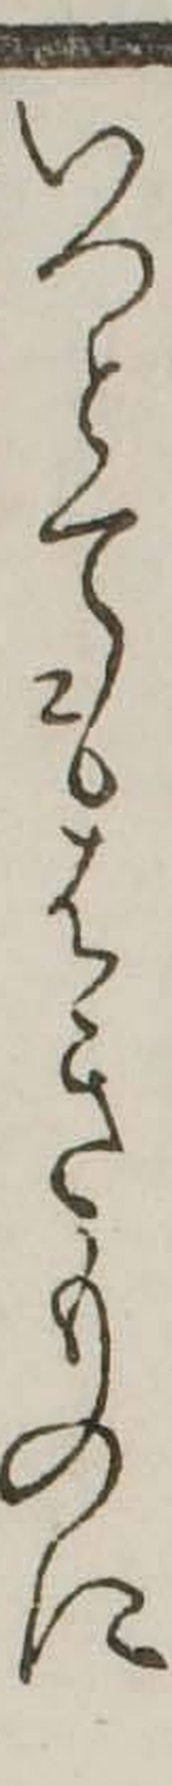いつとてもはきものに
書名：繪本不盡泉
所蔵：国文学研究資料館
